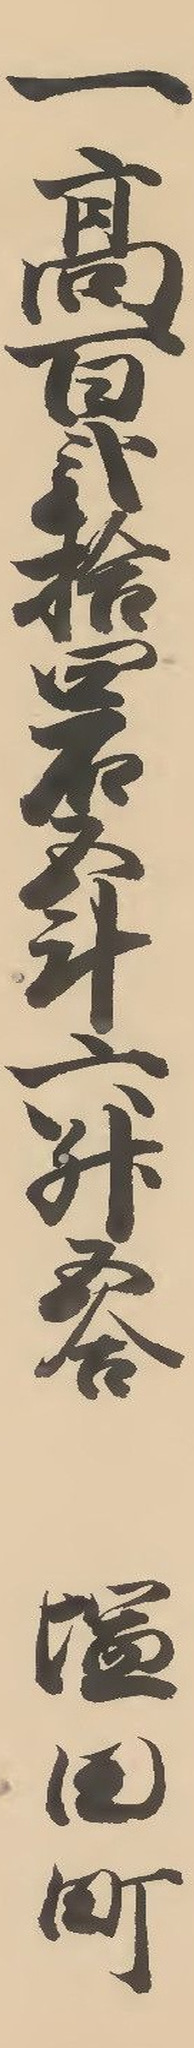一髙百弐拾四石五斗六升五合塩田町
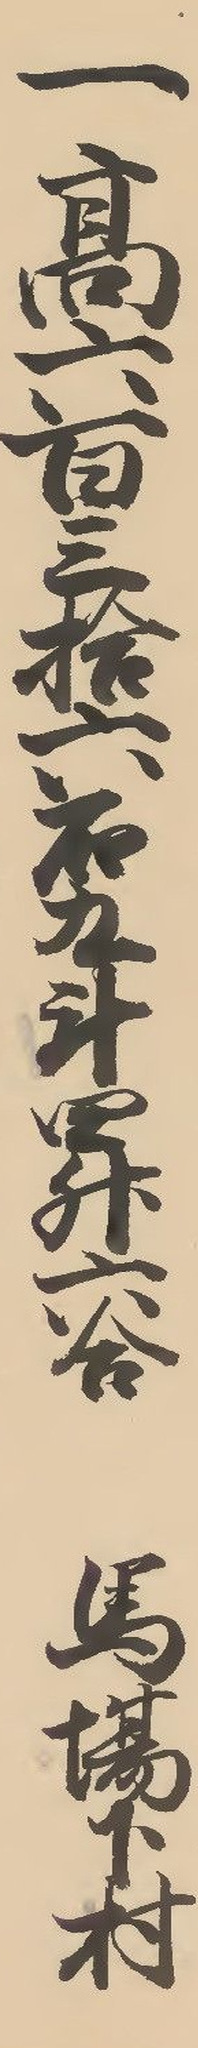一髙六百三拾六石九斗四升六合馬場下村
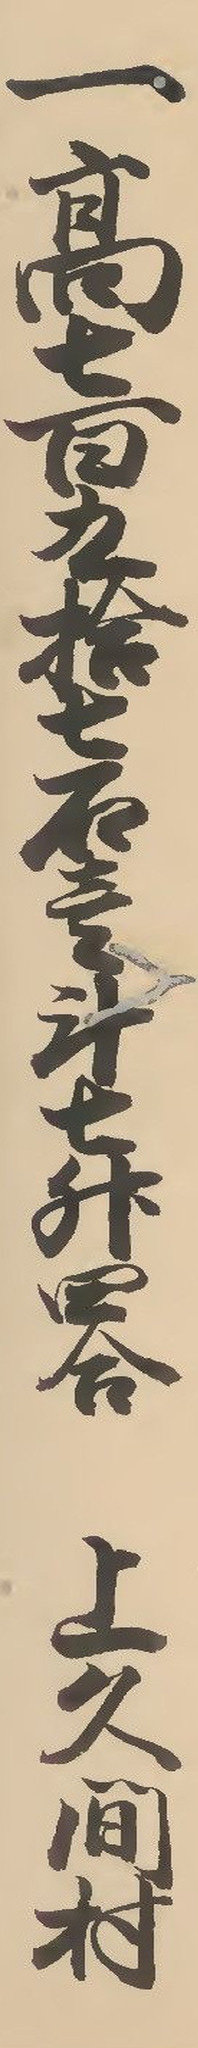一髙七百九拾七石壱斗七升四合上久間村
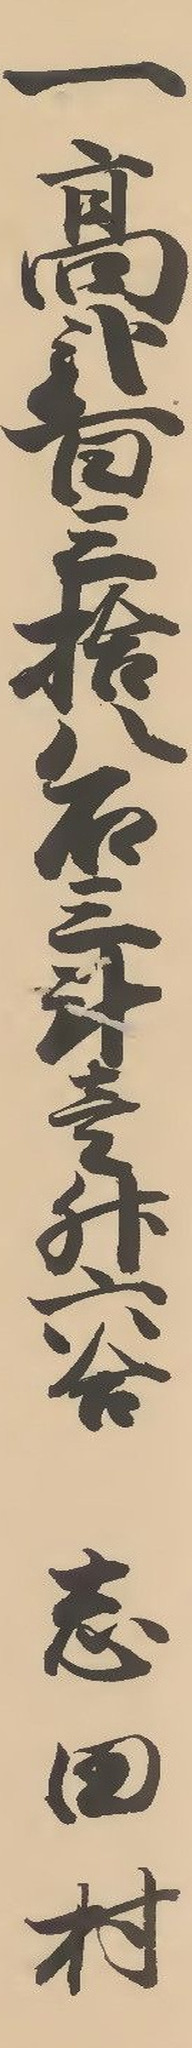一髙弐百三拾八石三斗壱升六合志田村
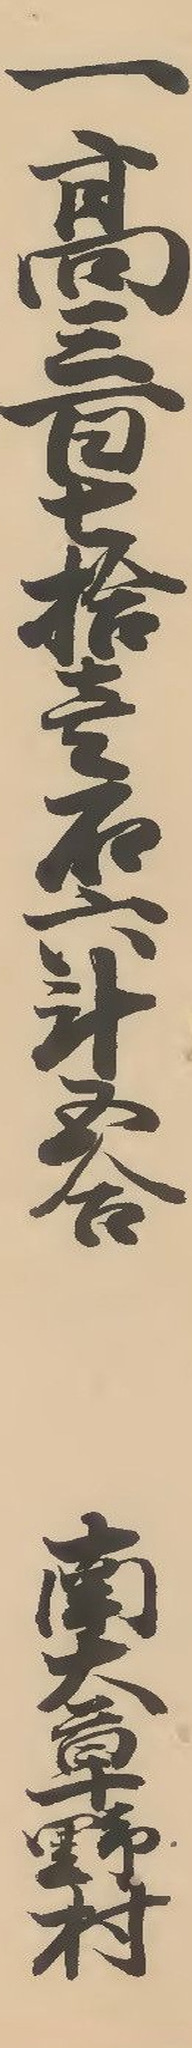一髙三百七拾壱石六斗五合南大草野村
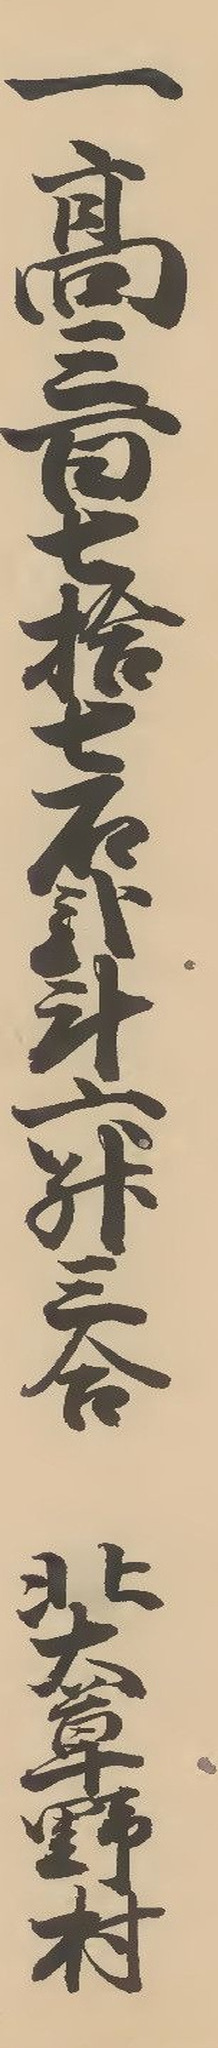一髙三百七拾七石弐斗六升三合北大草野村
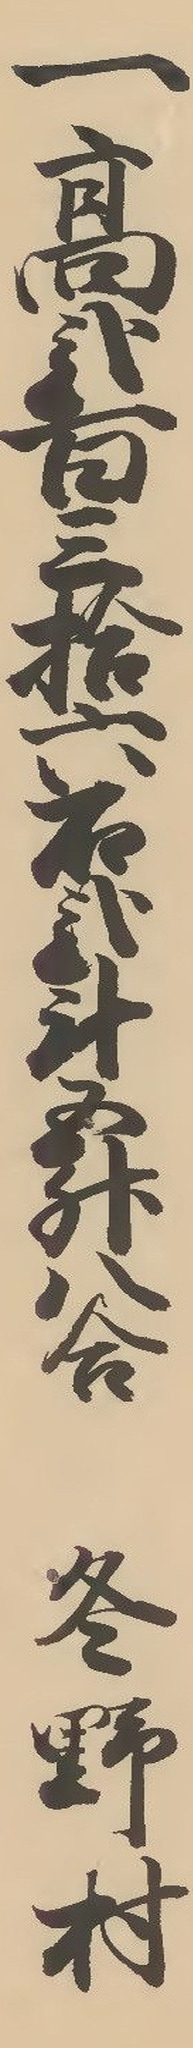一髙弐百三拾六石弐斗五升八合冬野村

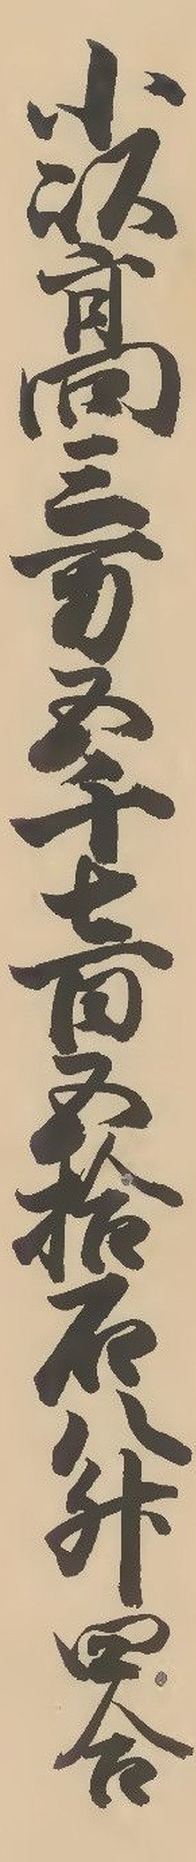小以髙三万五千七百五拾石八升四合
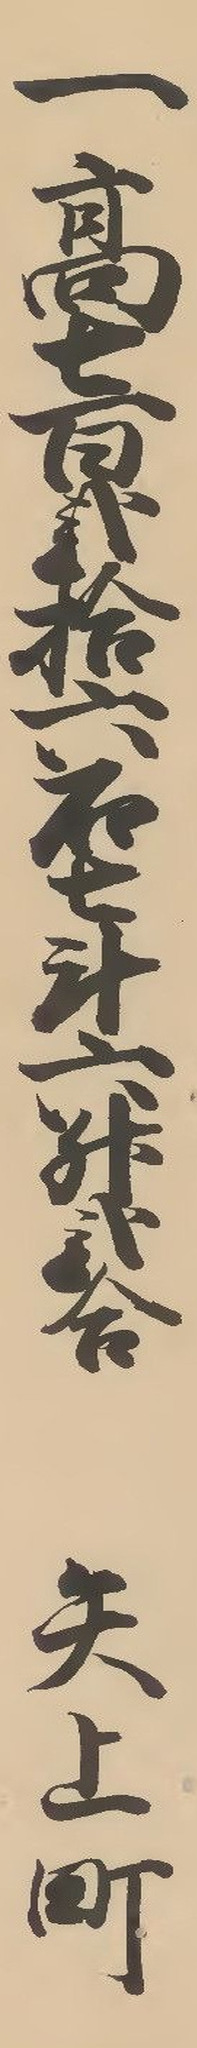一髙七百弐拾六石七斗六升弐合矢上町
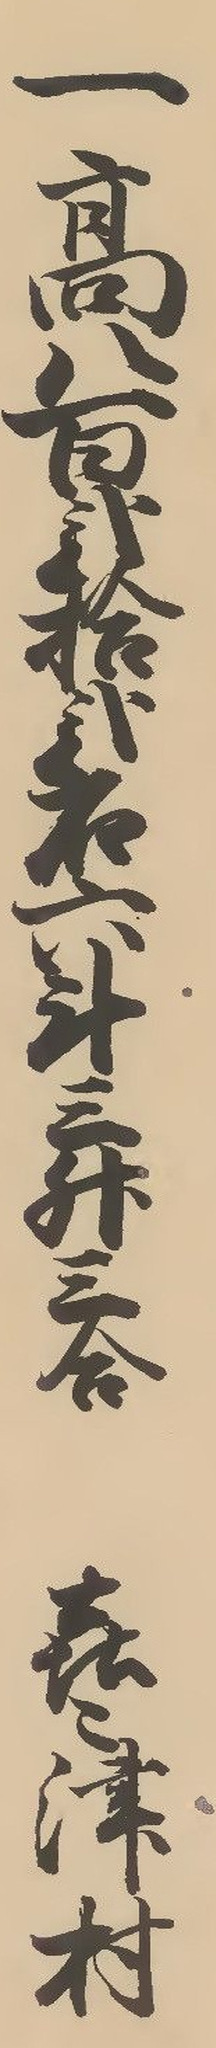一髙八百弐拾弐石六斗三升三合喜々津村
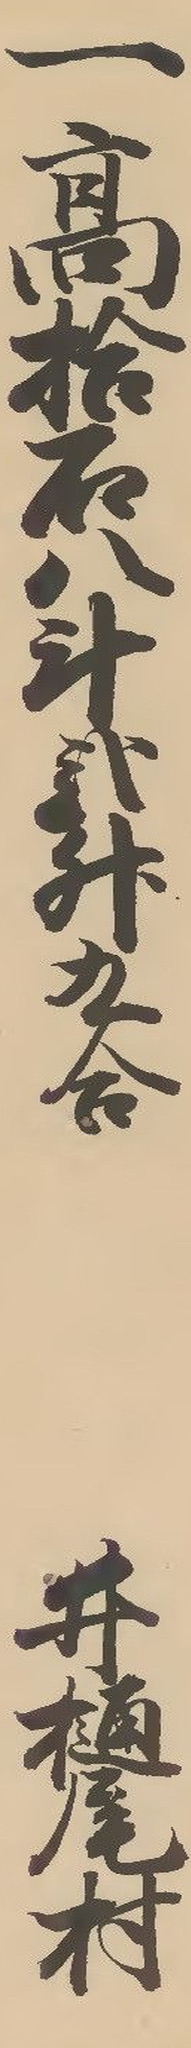一髙拾石八斗弐升九合井樋尾村

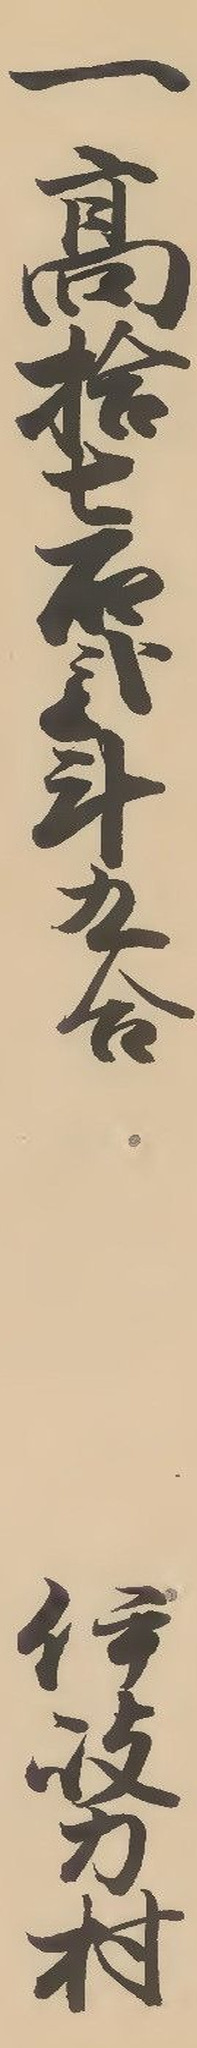一髙拾七石弐斗九合伊岐力村
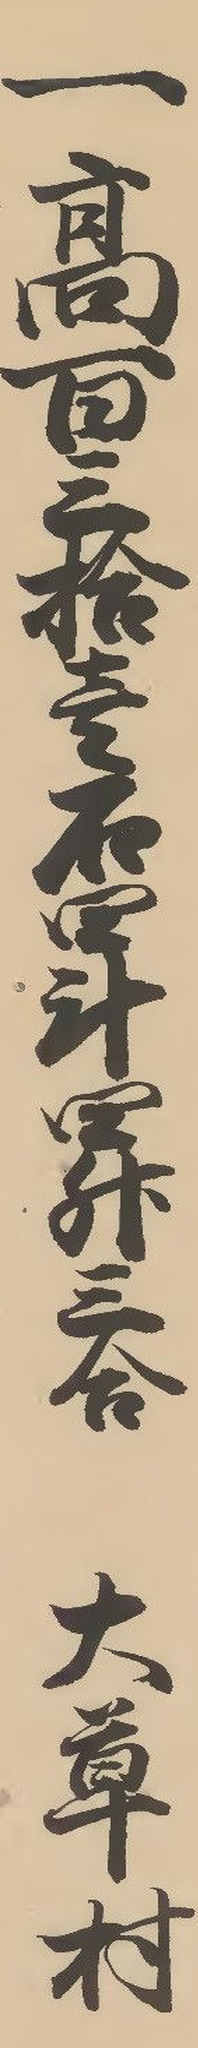一髙百三拾壱石四斗四升三合大草村
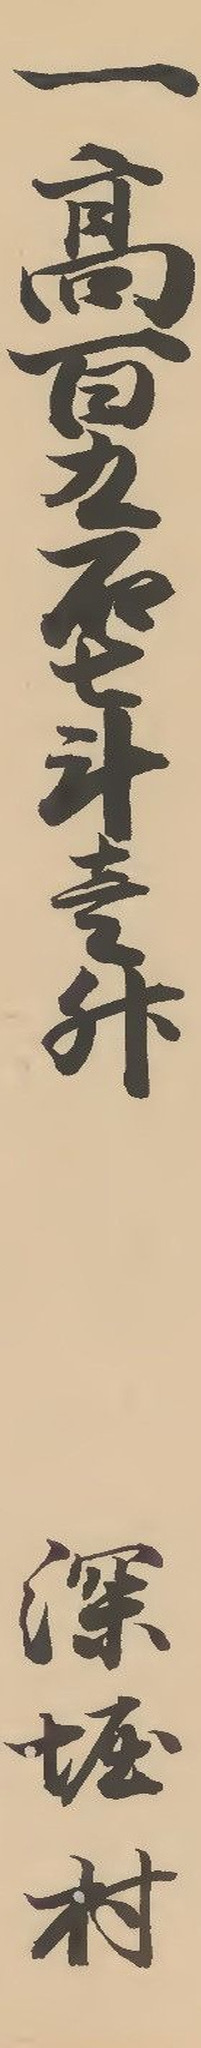一髙百九石七斗壱升深堀村
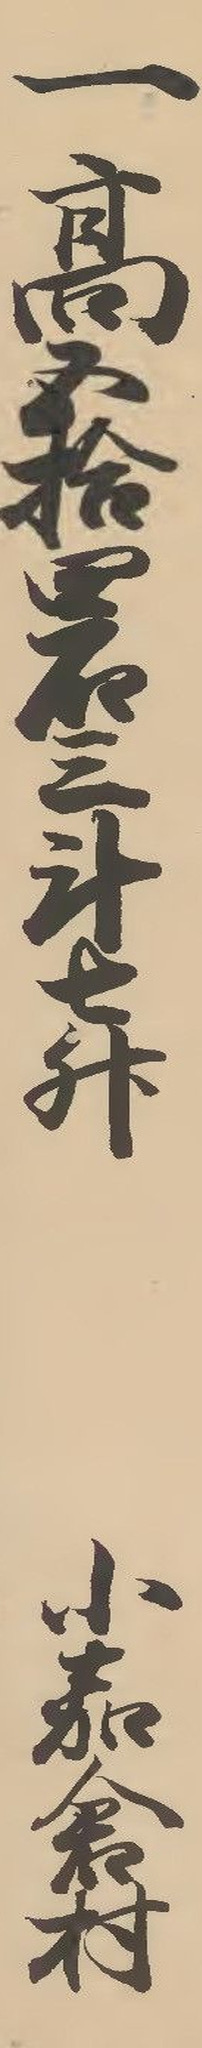一髙五拾四石三斗七升小嘉倉村
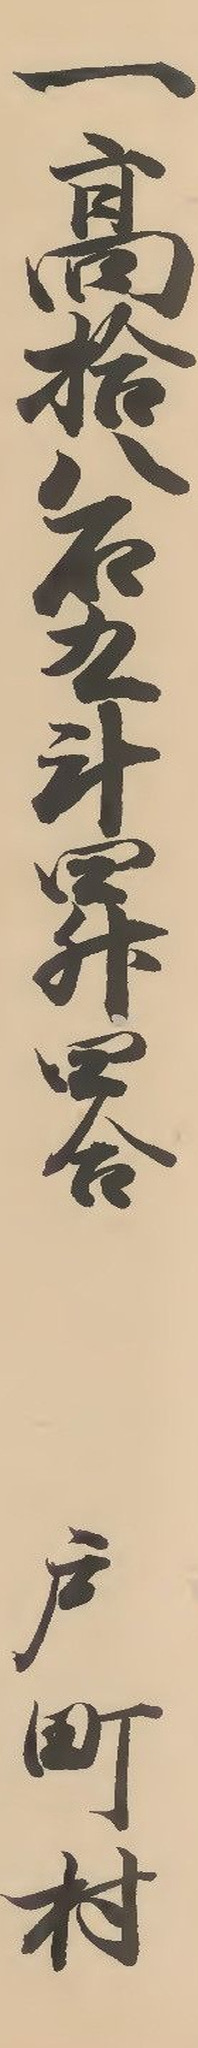一髙拾八石九斗四升四合戸町村
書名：肥前国郷帳
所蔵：国立公文書館 National Archives of Japan
